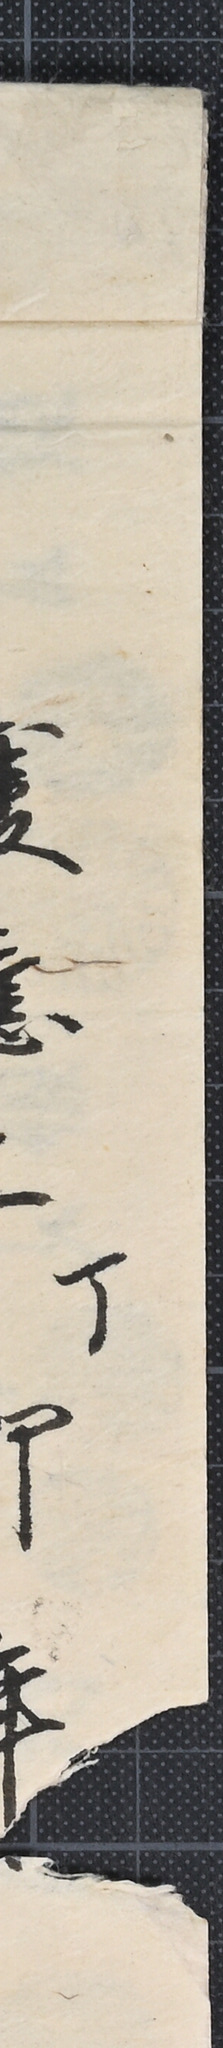慶應三丁卯年
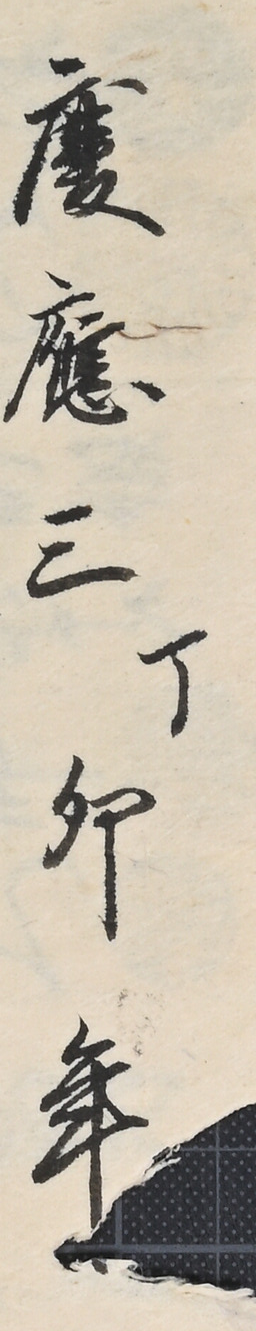慶應三丁卯年
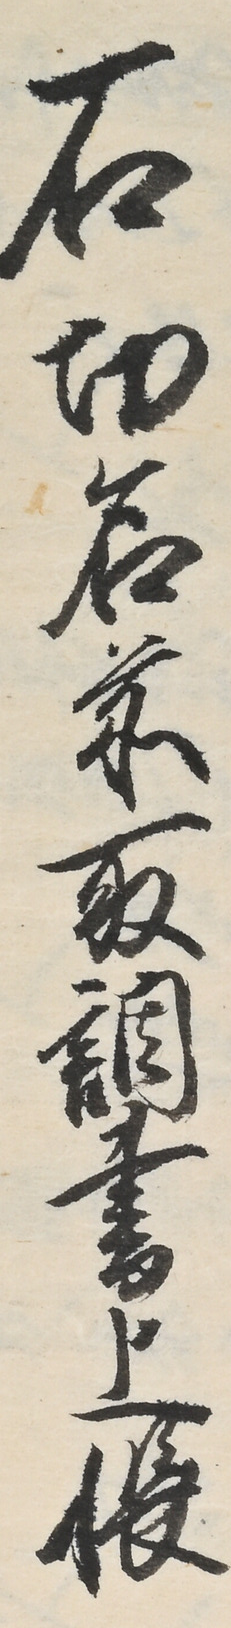石切名前取調書上帳
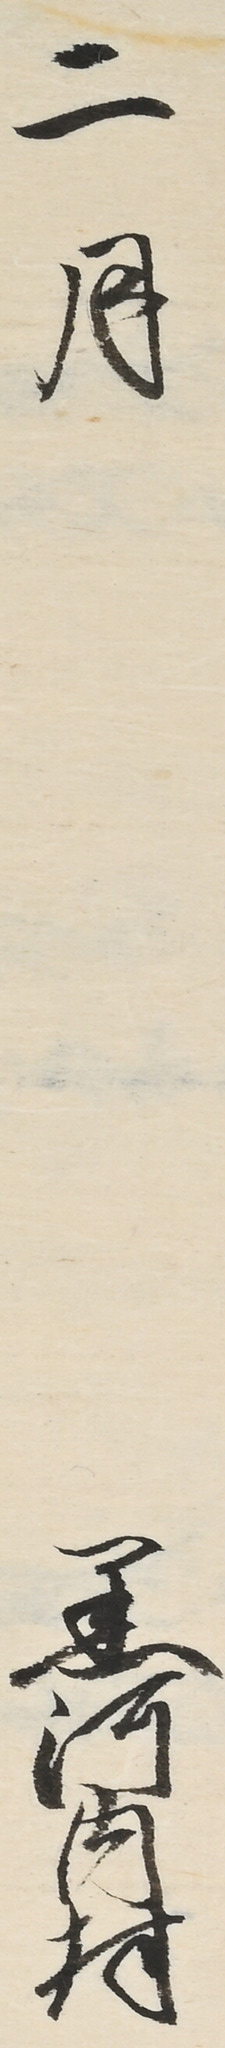二月黒河内村

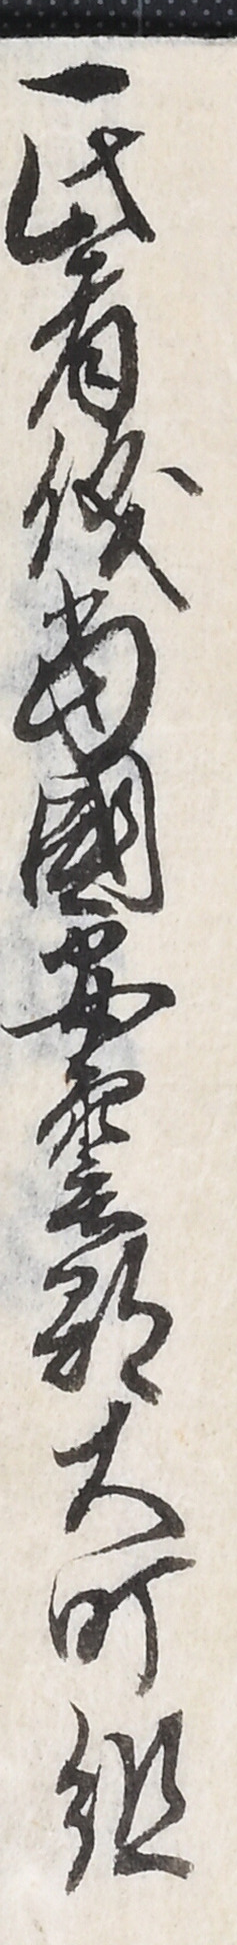一此者儀当国安曇郡大町組
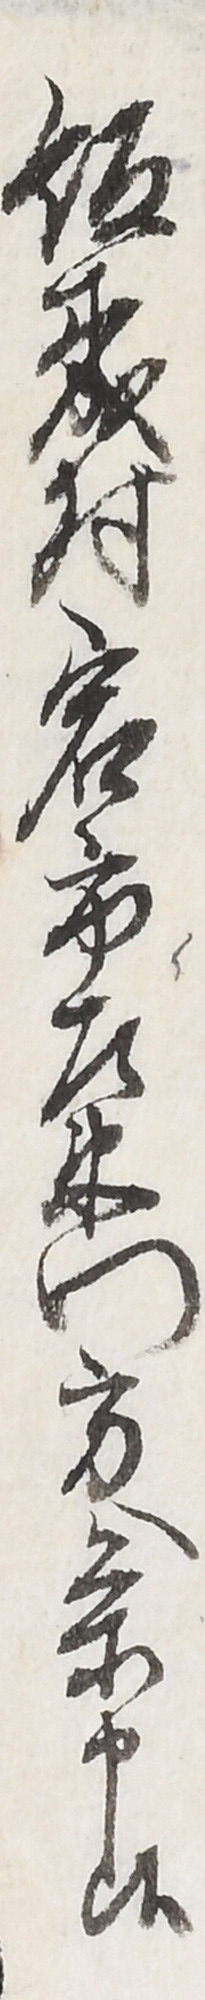飯森村宿市左衛門方へ参申候
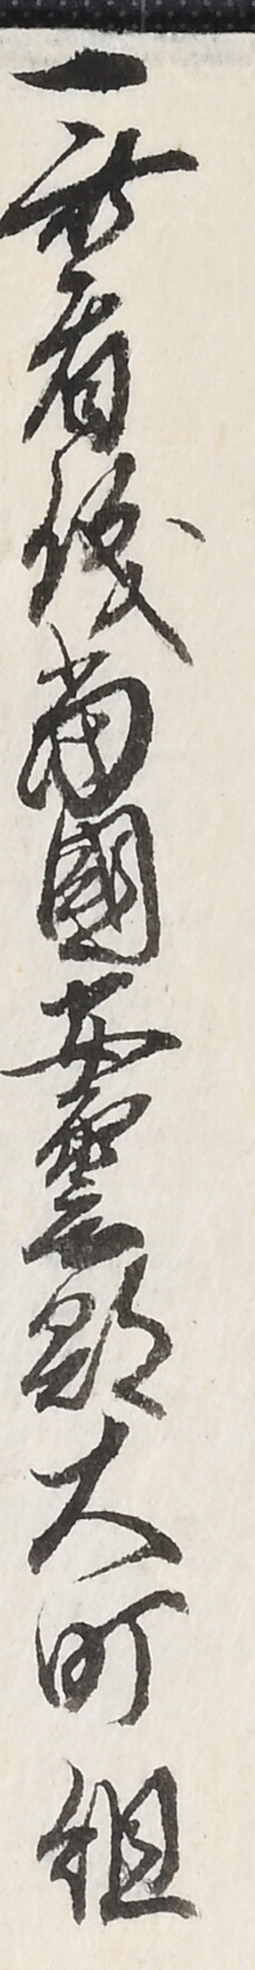一此者儀当国安曇郡大町組
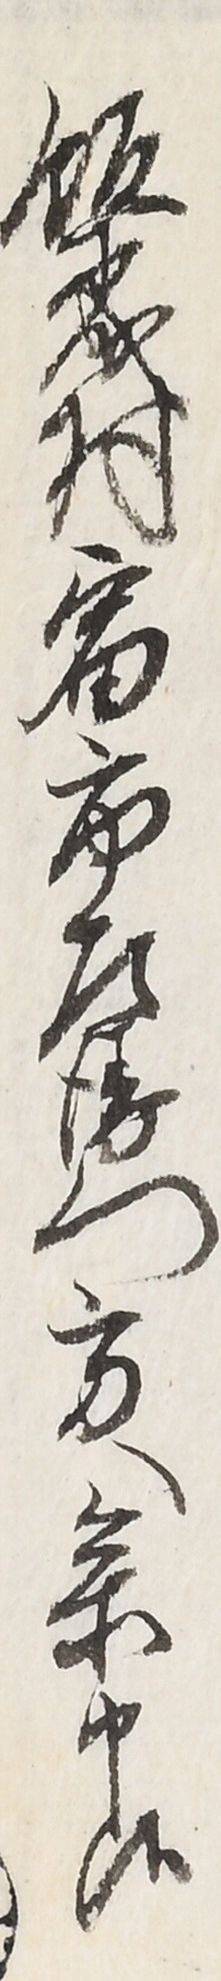飯森村宿市左衛門方へ参申候
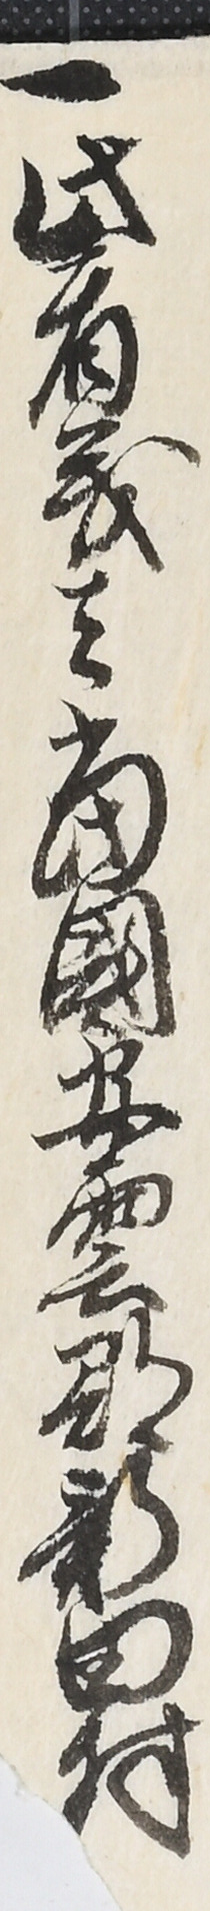一此者義者当国安曇郡新田村
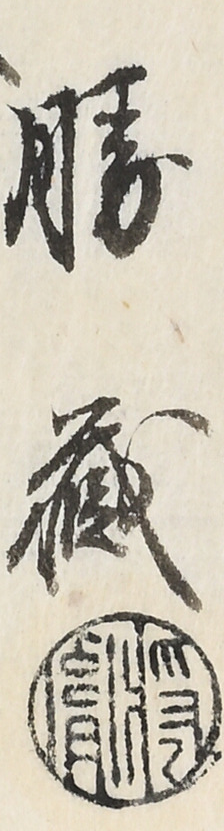勝蔵㊞
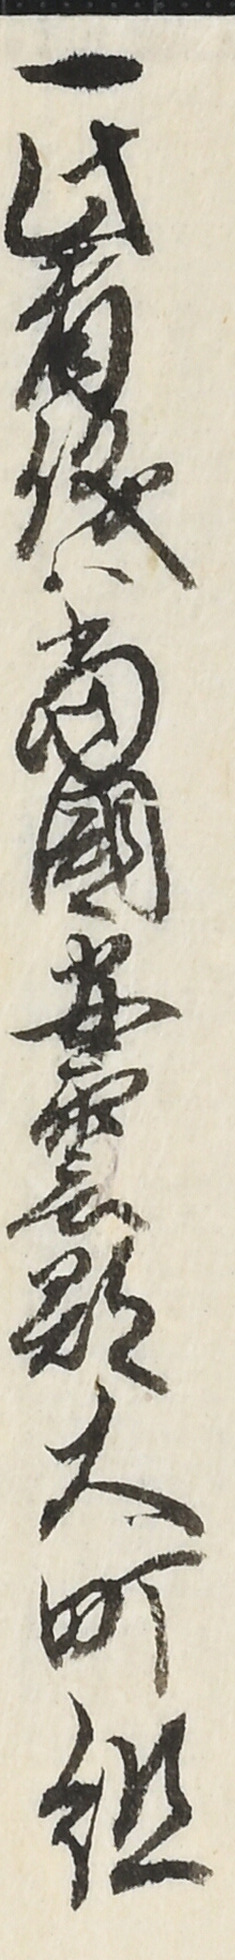一此者儀ハ当国安曇郡大町組
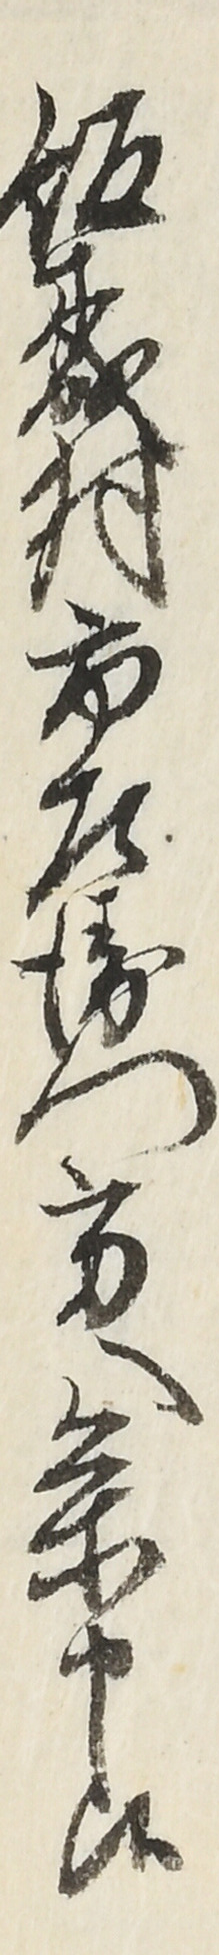飯森村市左衛門方へ参申候

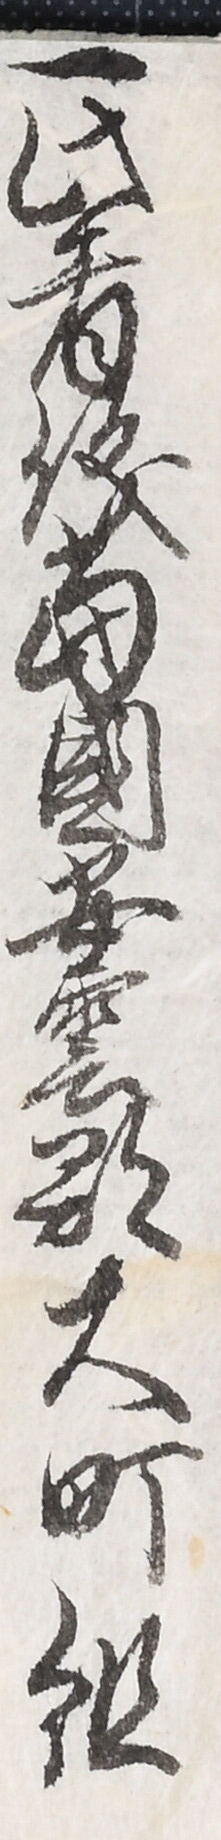一此者儀当国安曇郡大町組
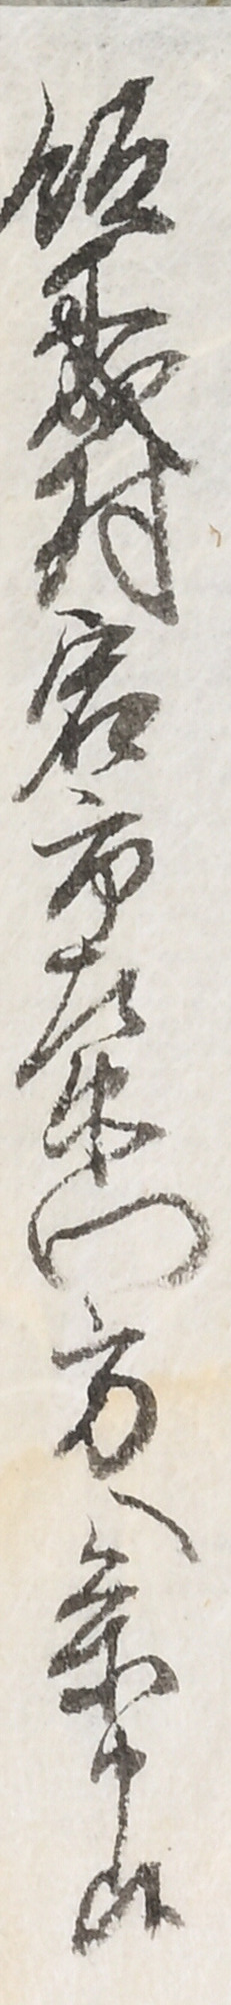飯森村宿市左衛門方へ参申候
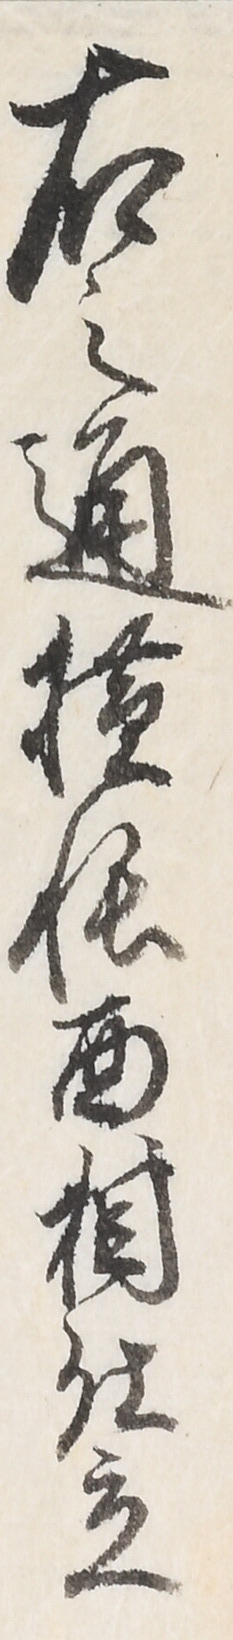右之通横帳面ニ相仕立
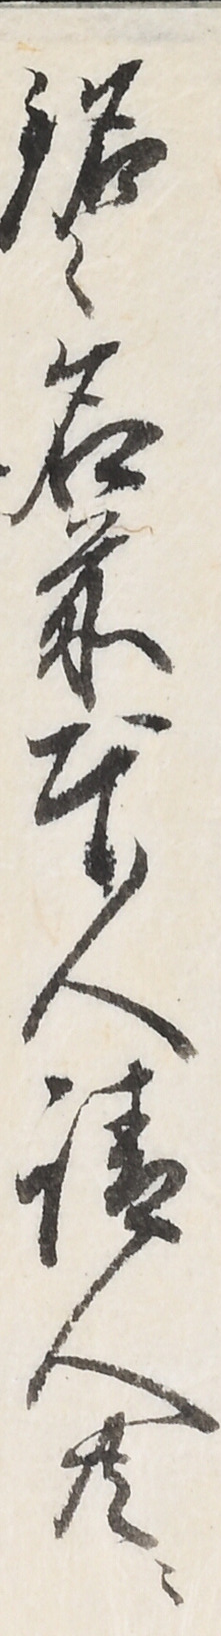銘々名前本人請人共ニ
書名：慶應三丁卯年二月石切名前取調書上帳
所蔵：伊那市立高遠町図書館・合同会社AMANE
